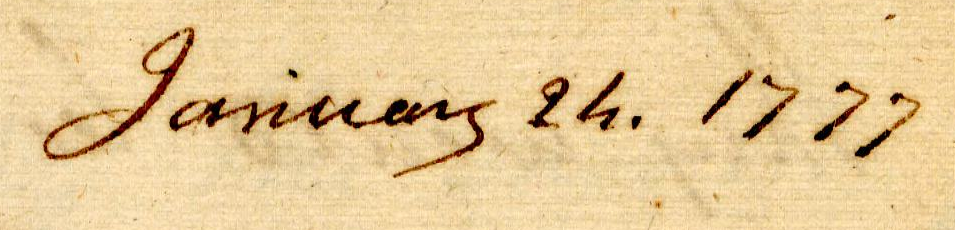January 24. 1777
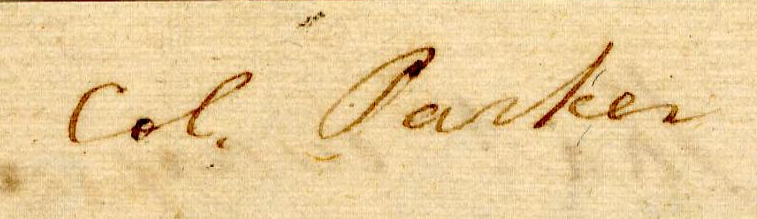Col. Parker
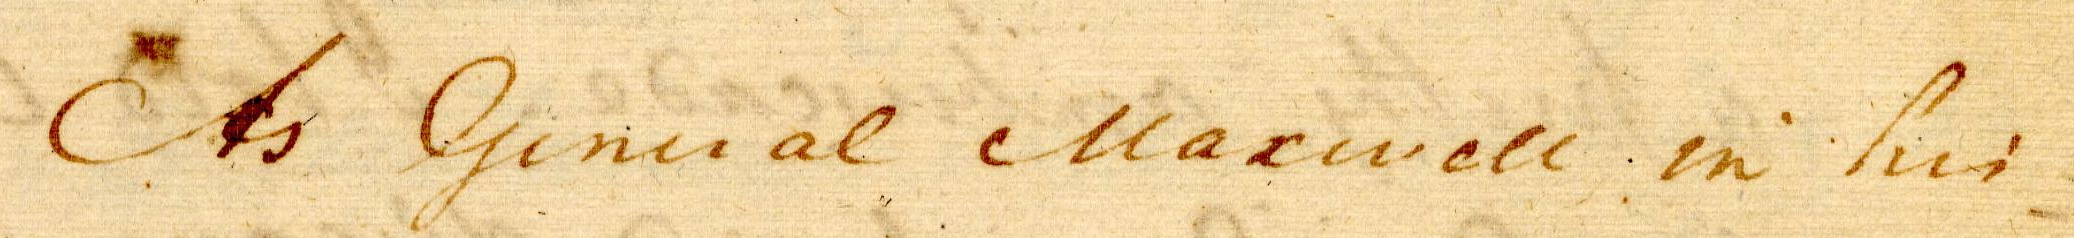As General Maxwell in his
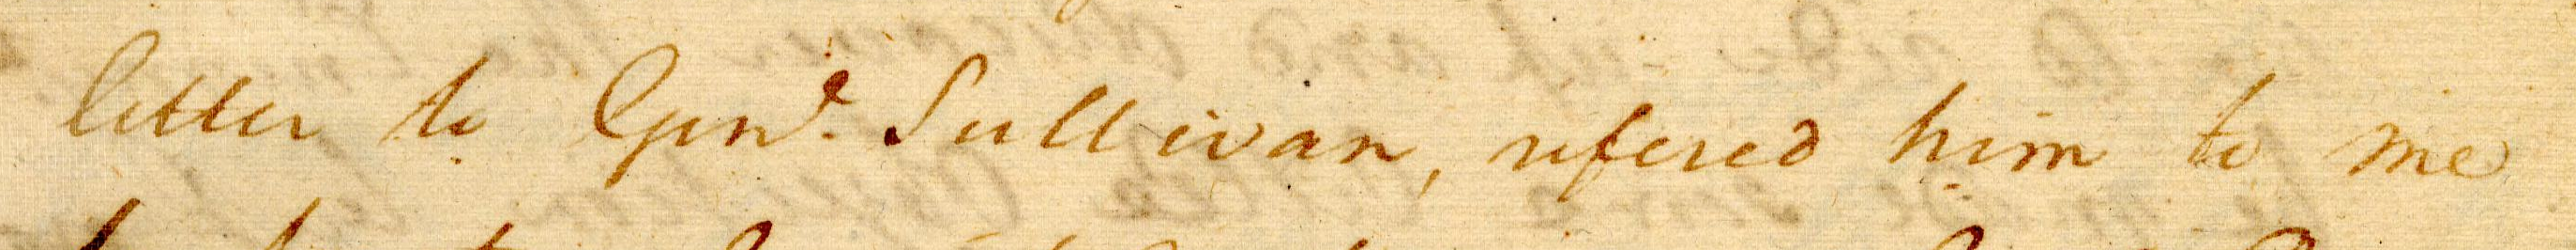letter to Gen^l. Sullivan, refered him to me
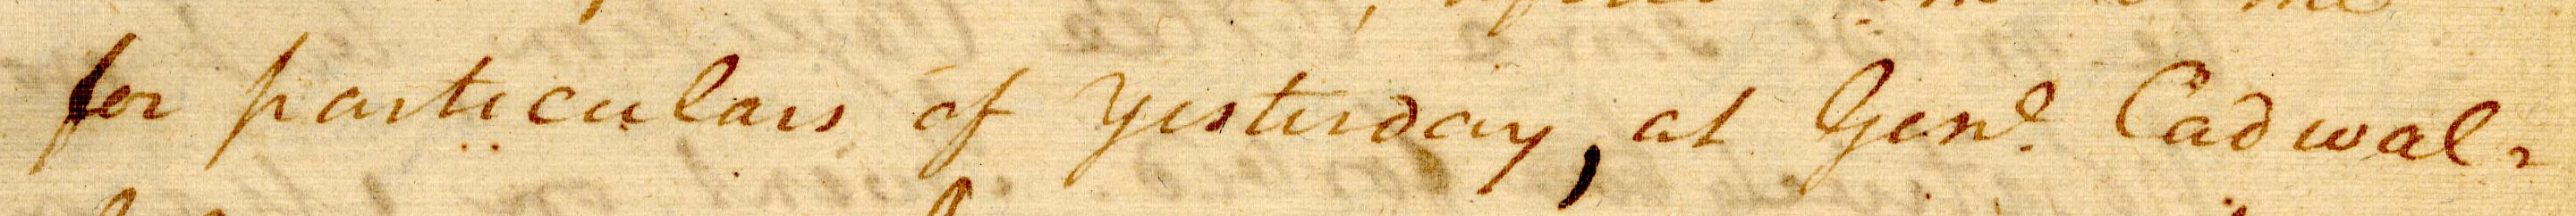for particulars of yesterday, at Gen^l. Cadwal-
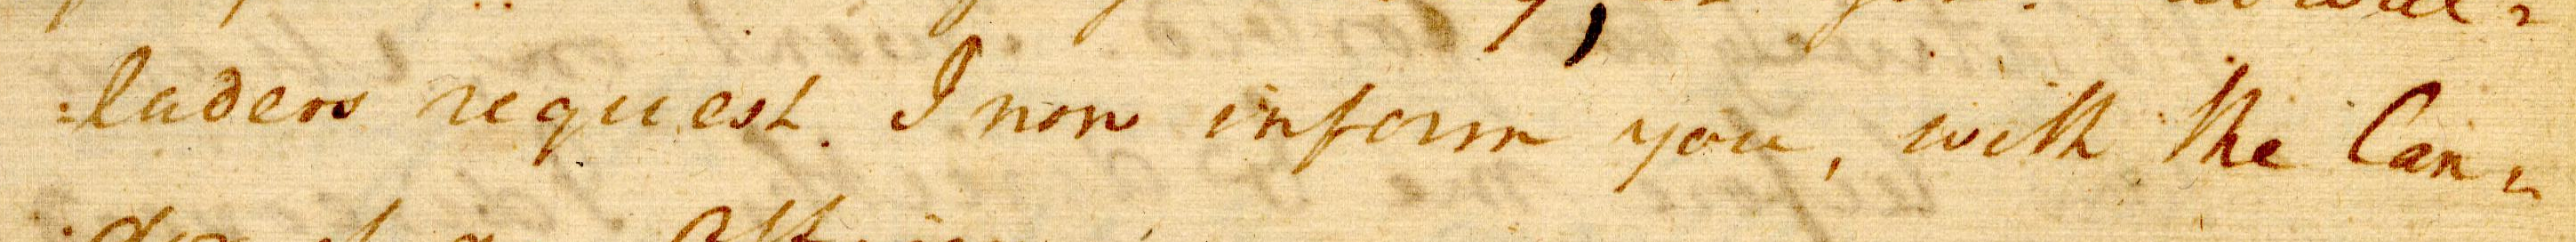-laders request. I now inform you, with the Can-
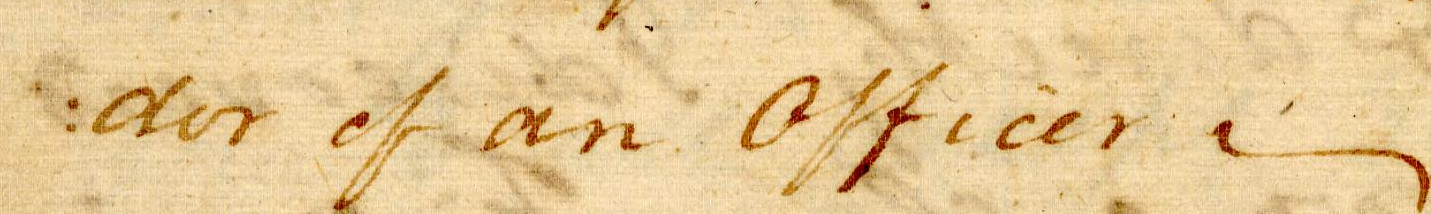-dor of an Officer-
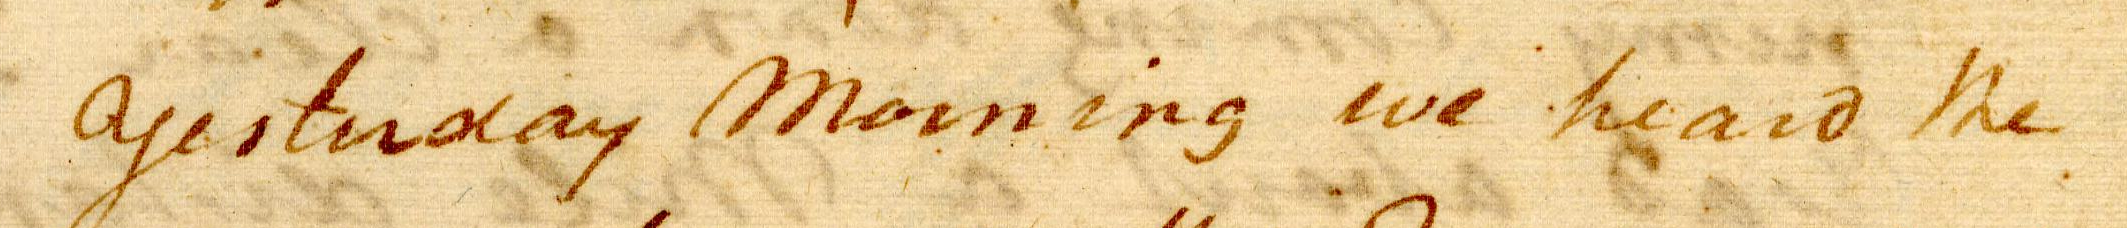Yesterday Morning we heard the
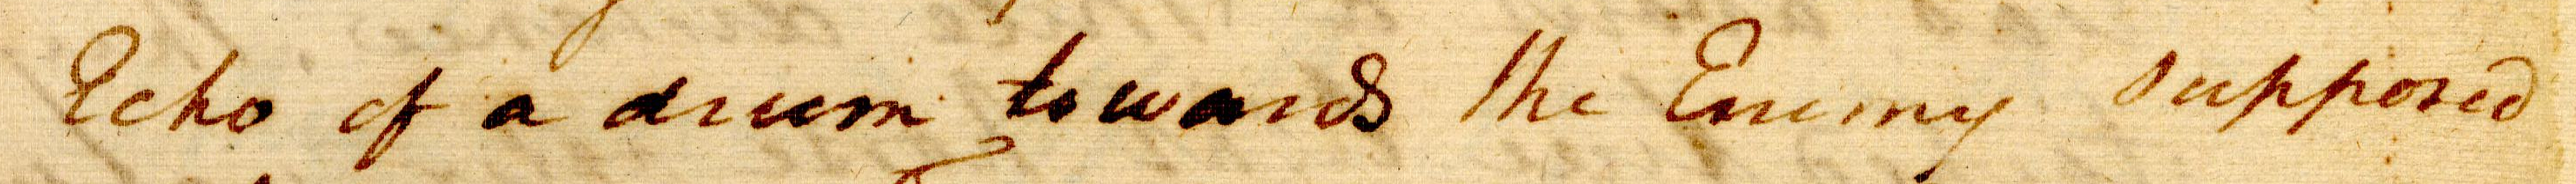Echo of a drum towards the Enemy supposed
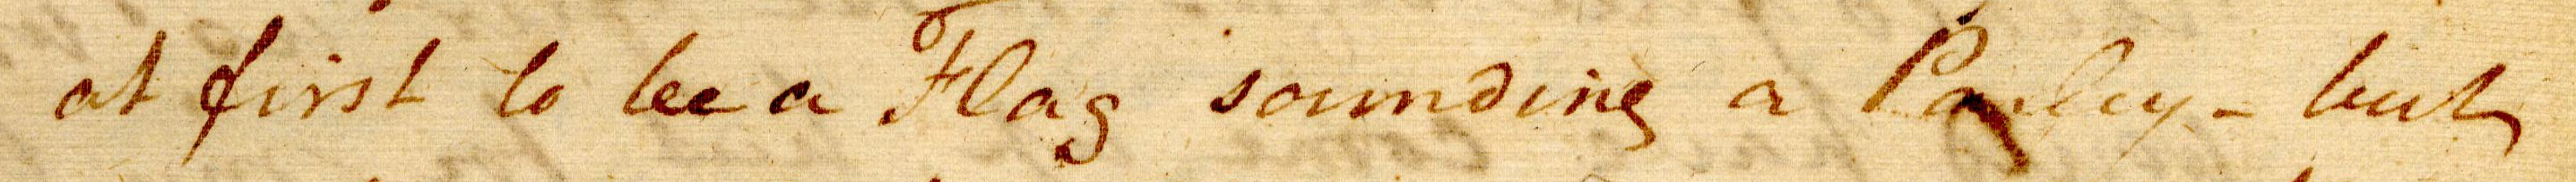at first to be a Flag sounding a Parley- but
